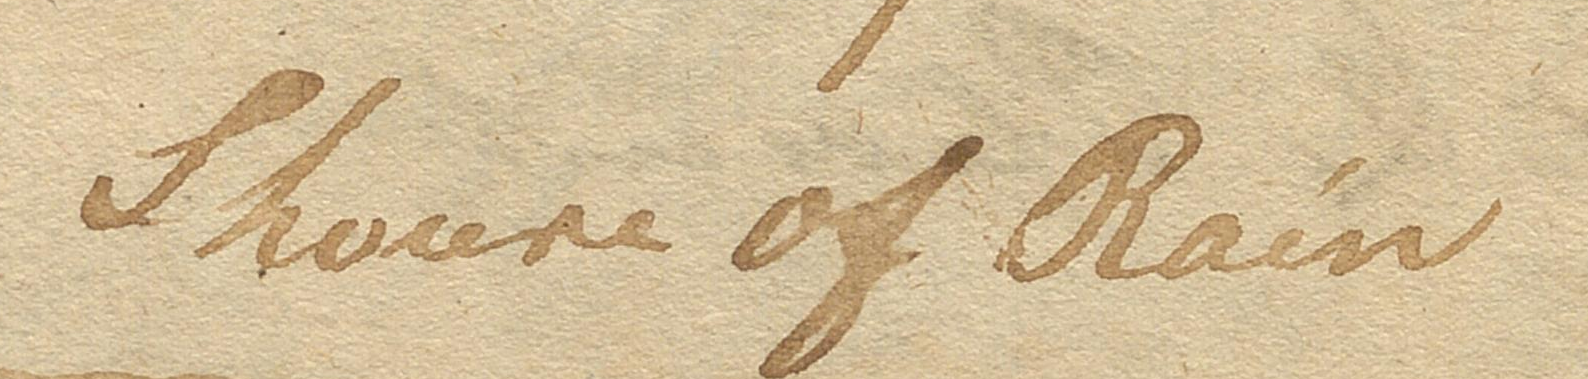Shoure of Rain
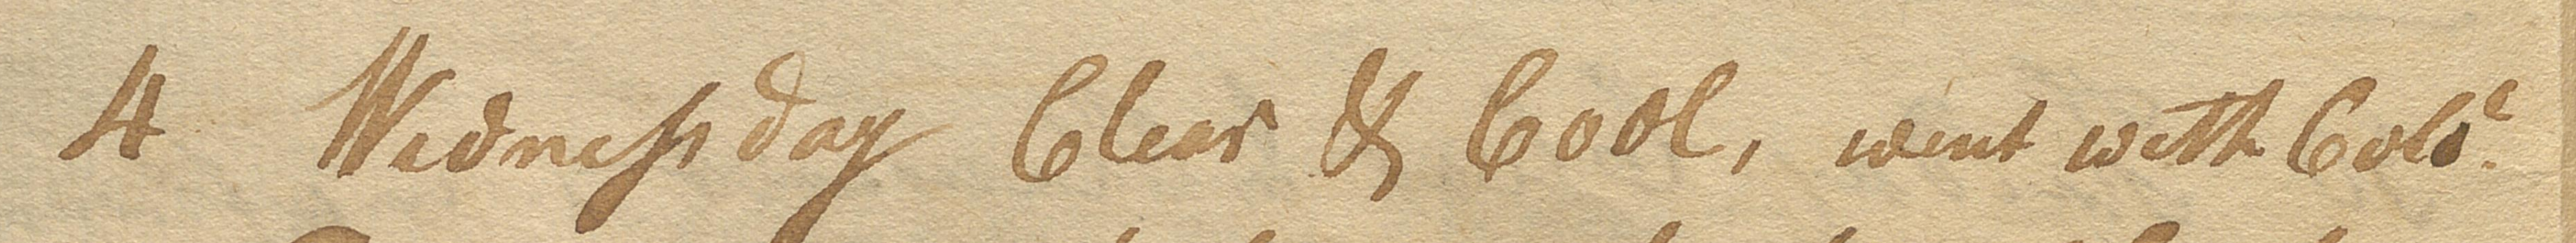4 Wednessday Clear & Cool, went with Colo^l.
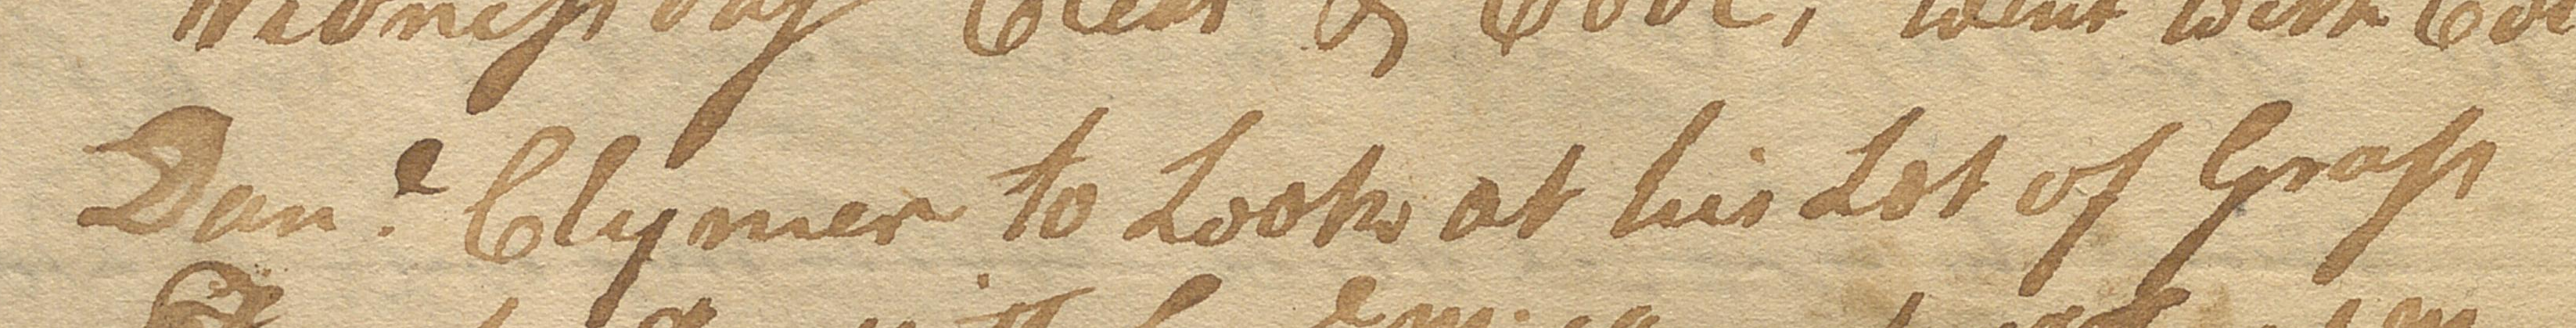Dan^l. Clymer to Look at his Lot of Grass
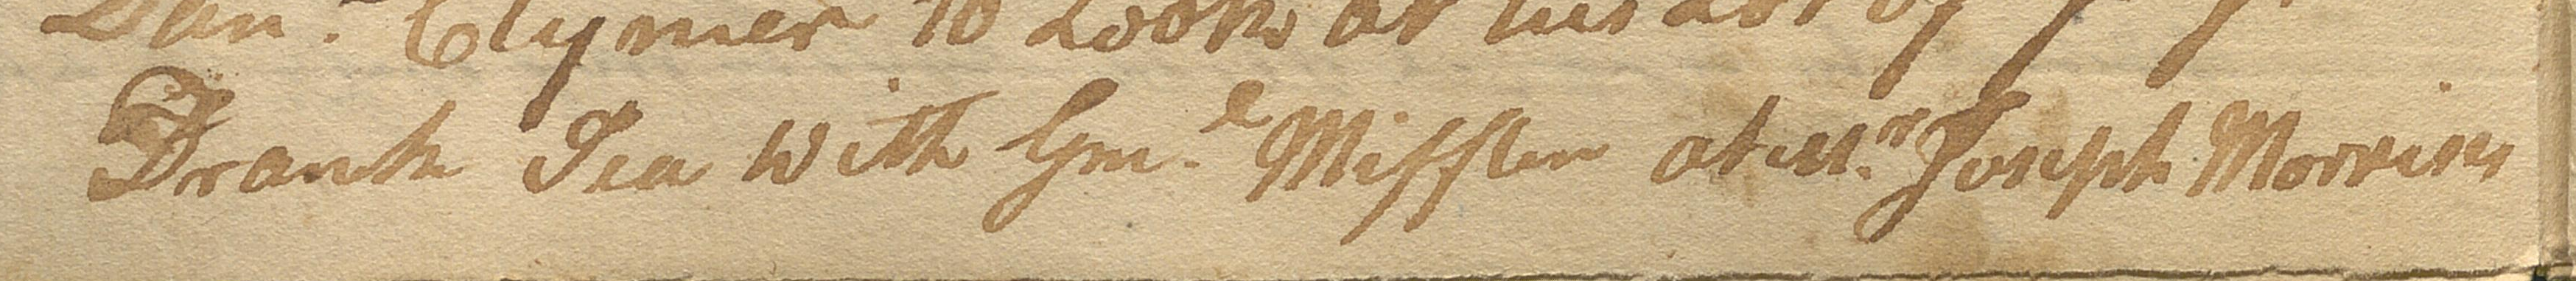Drank Tea with Gen^l. Mifflin at M^r. Joseph Morrises
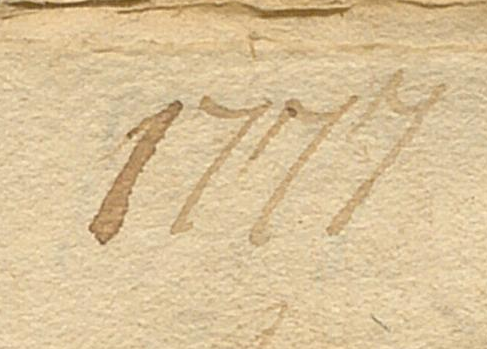17777
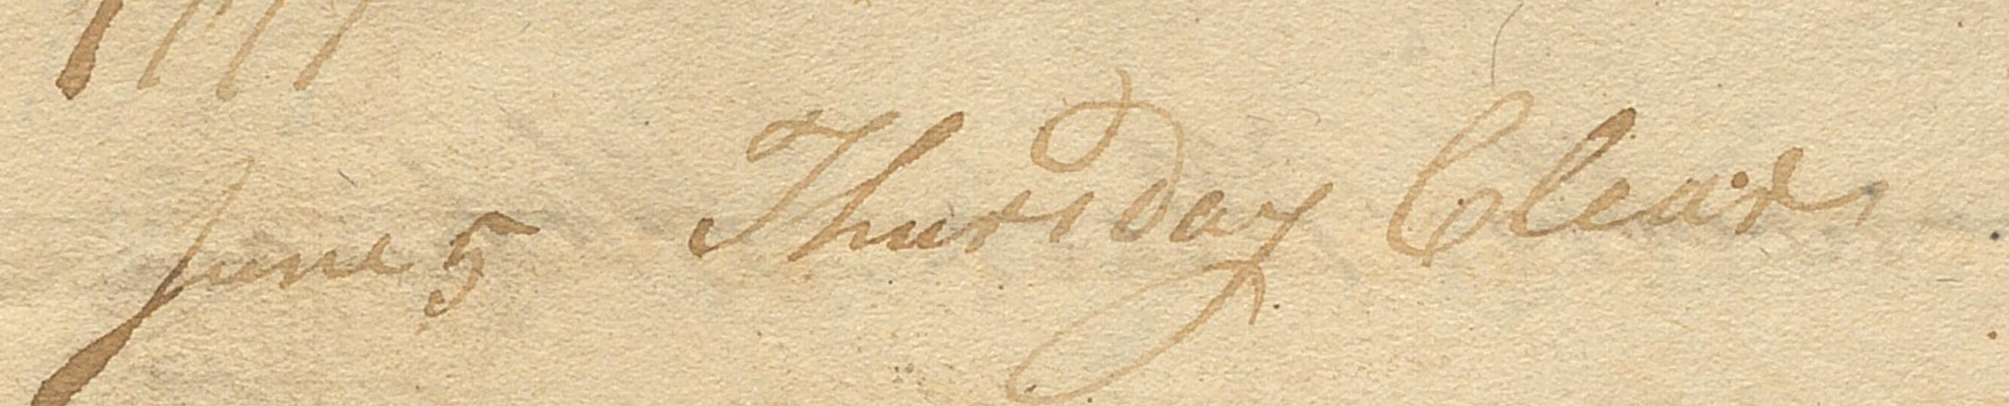June 5 Thursday Clear
